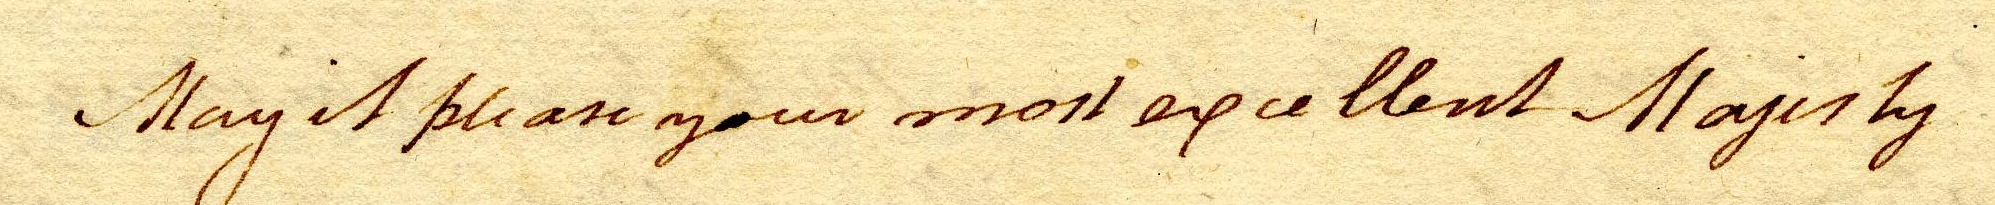May it please your most excellent Majesty
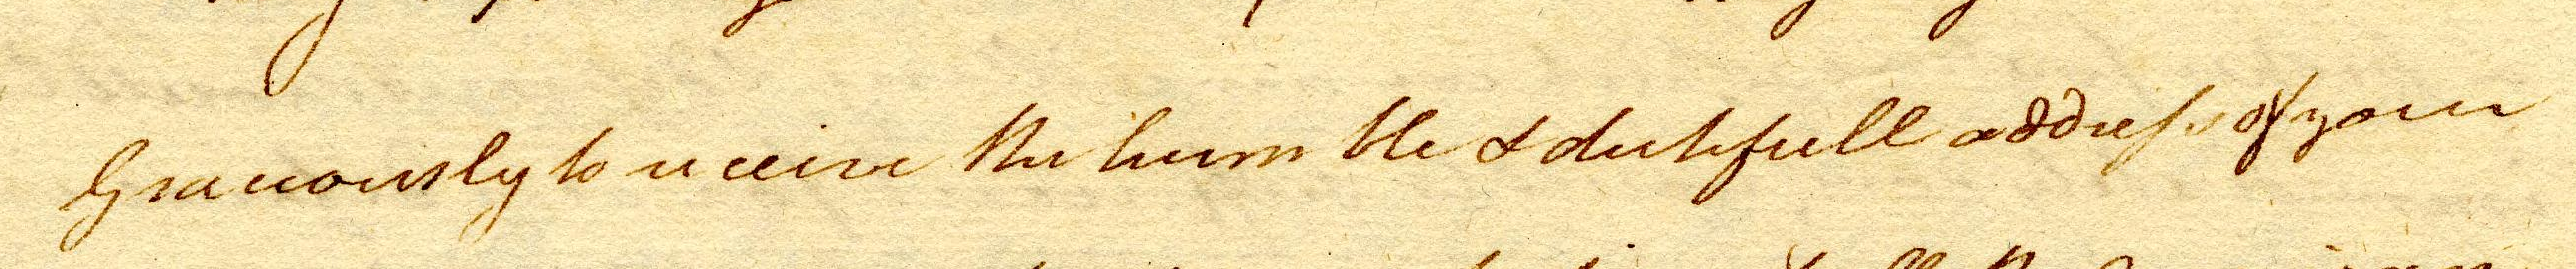Graciously to receive the humble & dutifull address of your
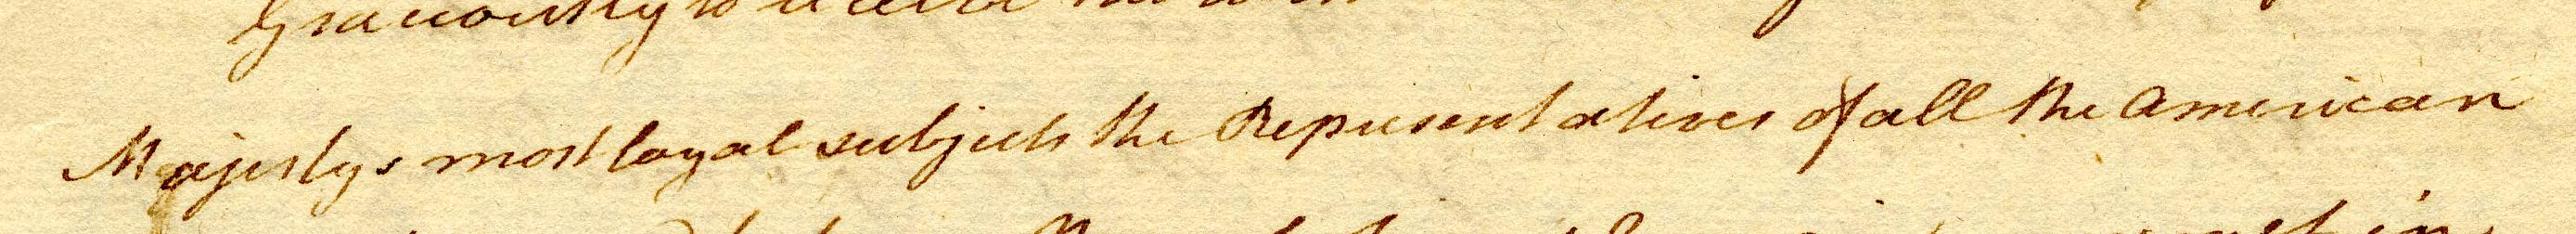Majestys most loyal subjects the Representatives of all the American
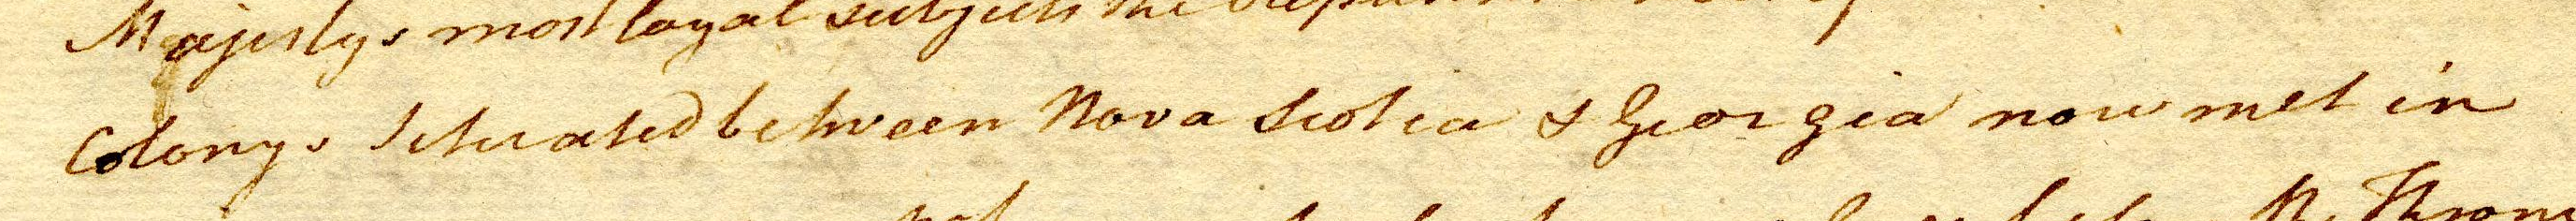Colonys situated between Nova Scotia & Georgia now met in
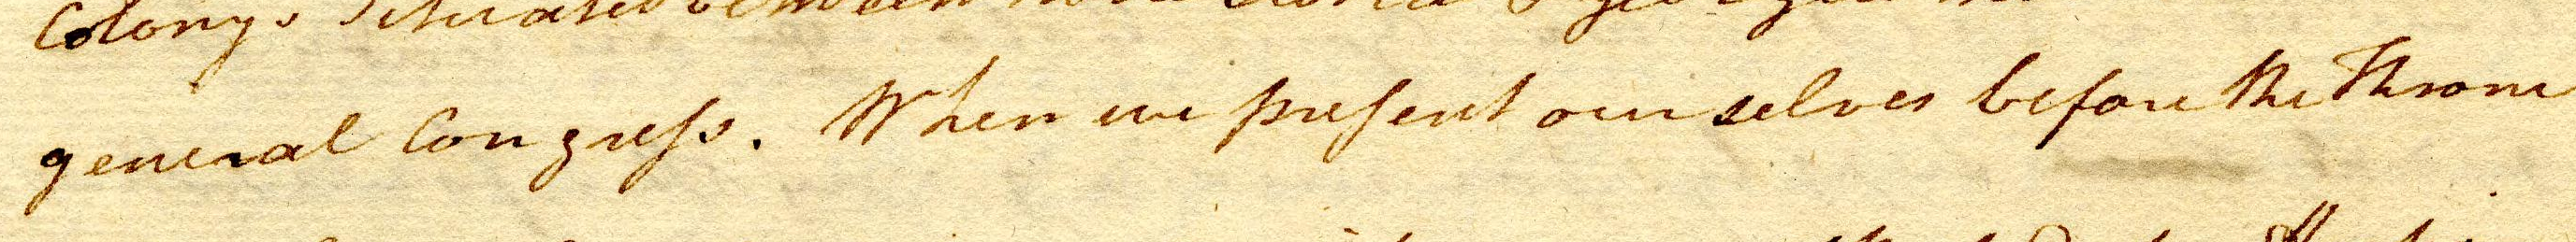general Congress. When we present ourselves before the Throne
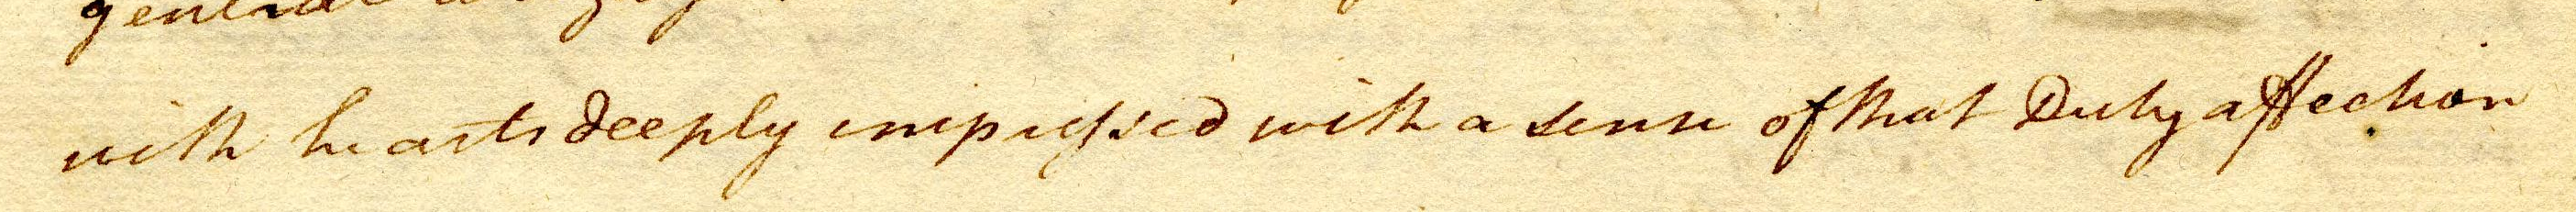with hearts deeply impressed with a sense of that Duty affection
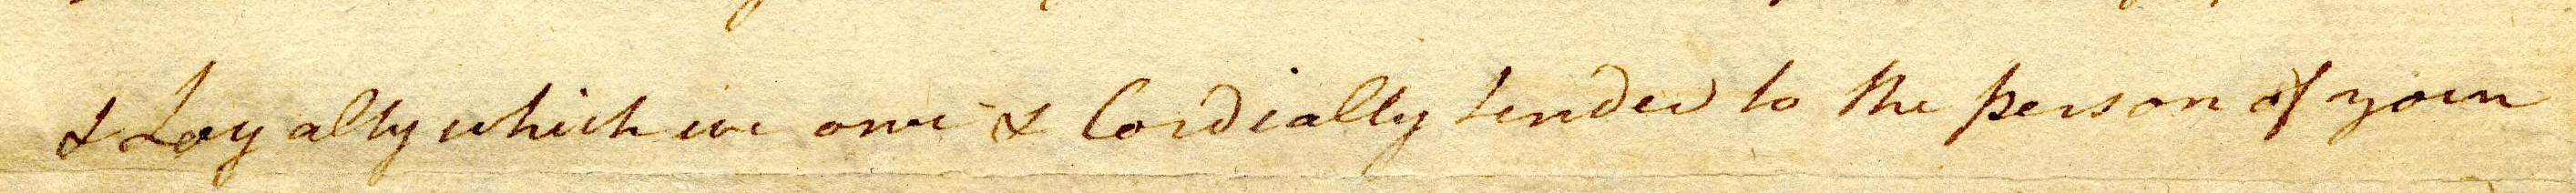& Loyalty which we owe & Cordially tender to the person of your
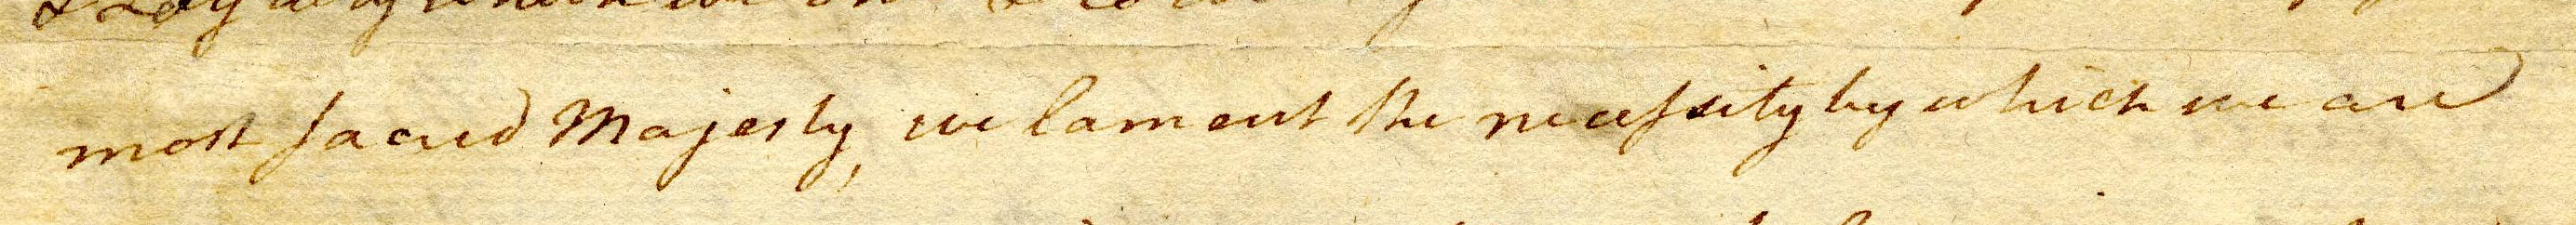most sacred Majesty, we lament the necessity by which we are
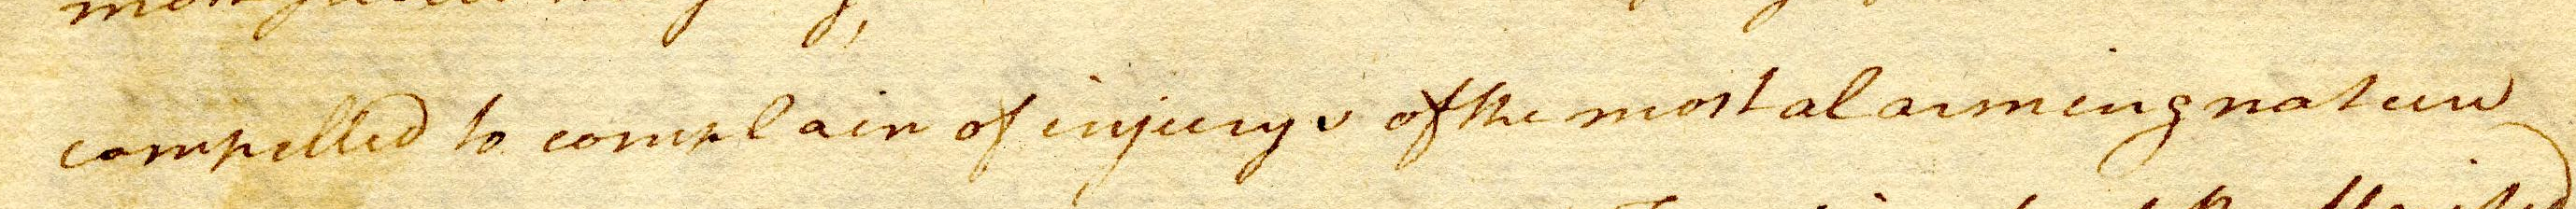compelled to complain of injurys of the most alarming nature
